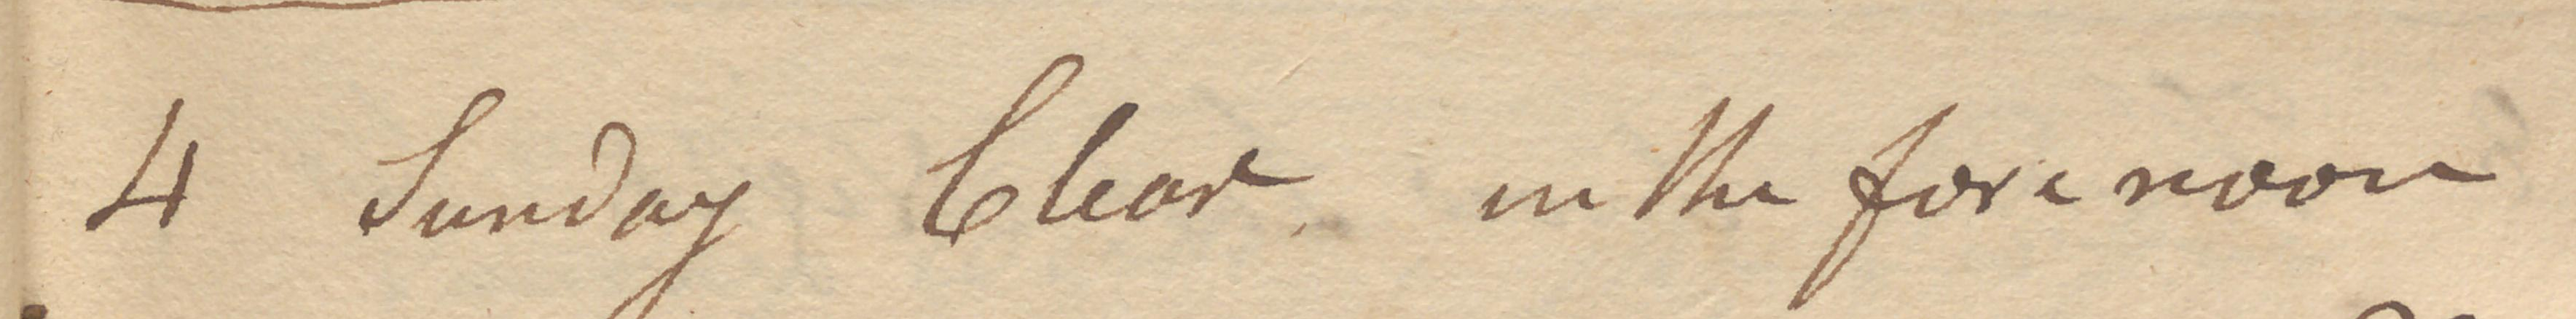4 Sunday Clear in the forenoon
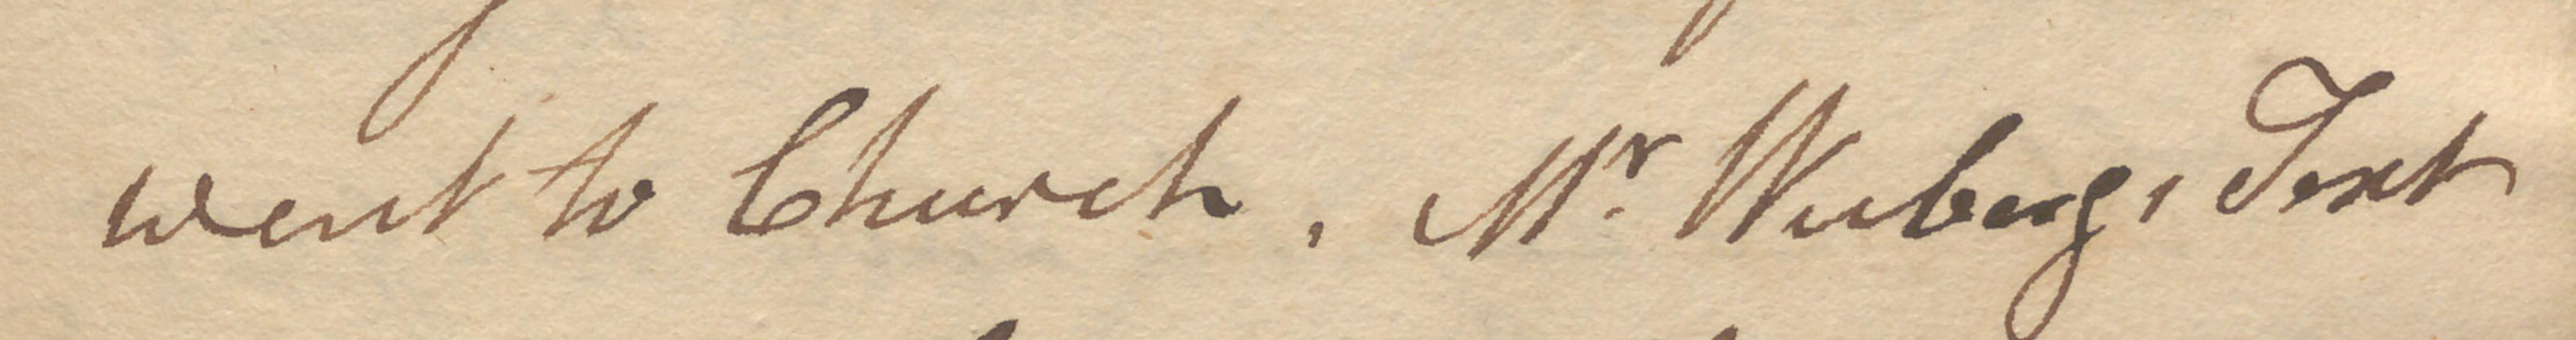went to Church. M^r. Weibergs Text
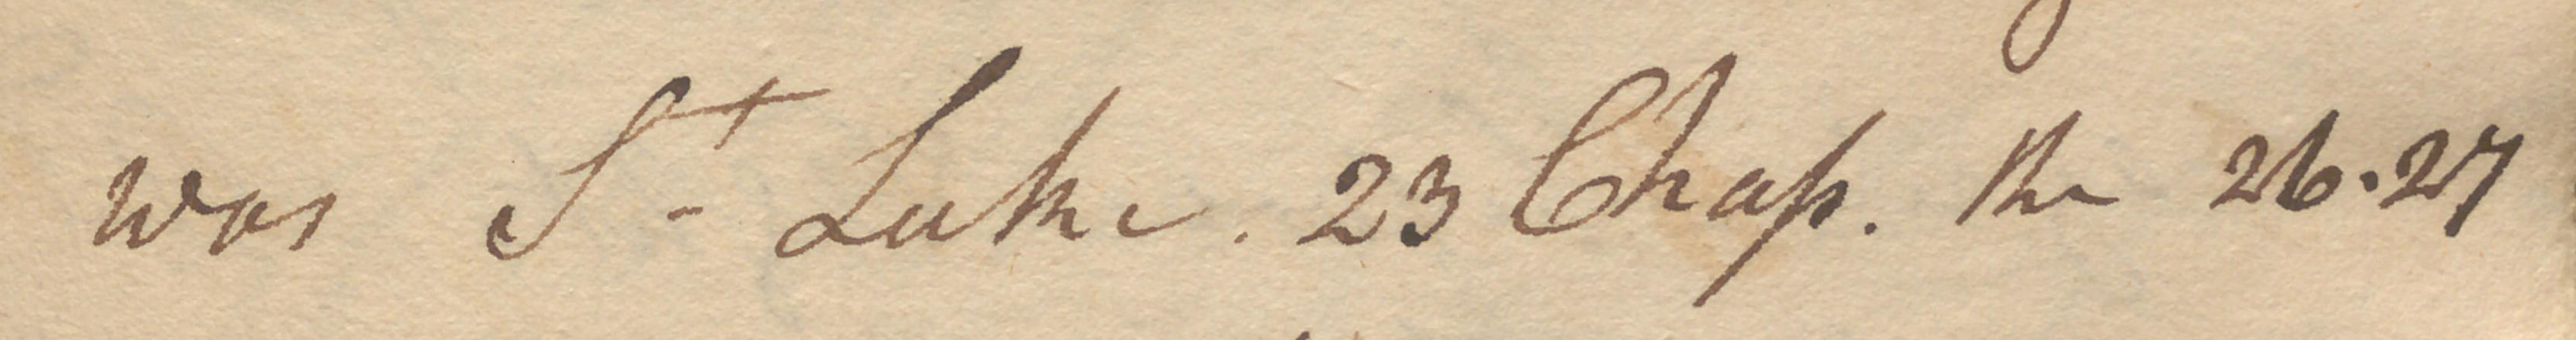was S^t. Luke 23 Chap. the 26.27
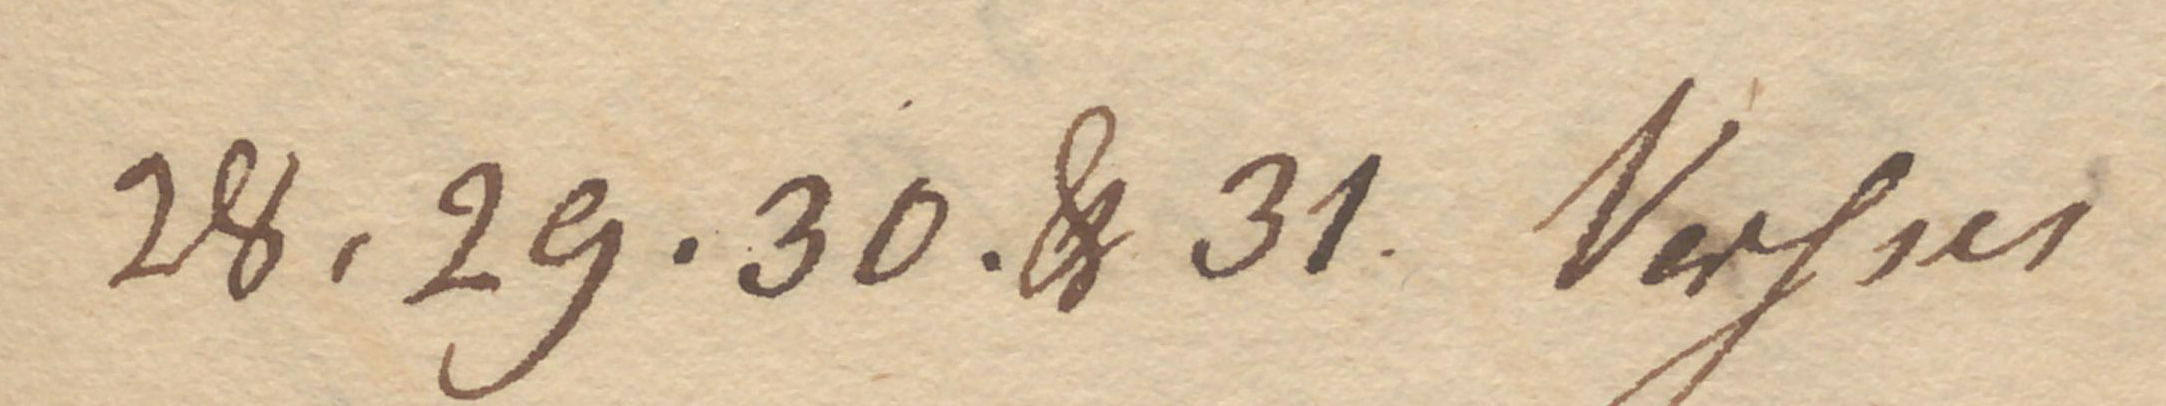28. 29. 30. & 31. Versses
